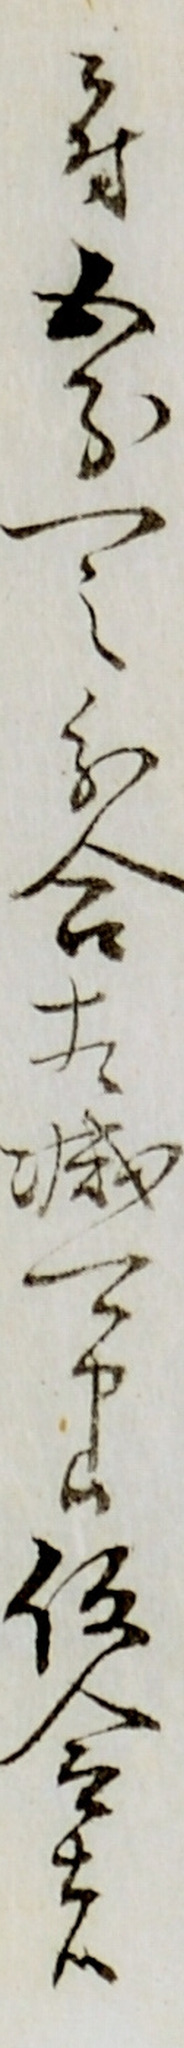に付五分一之分合相減可申候仮令は
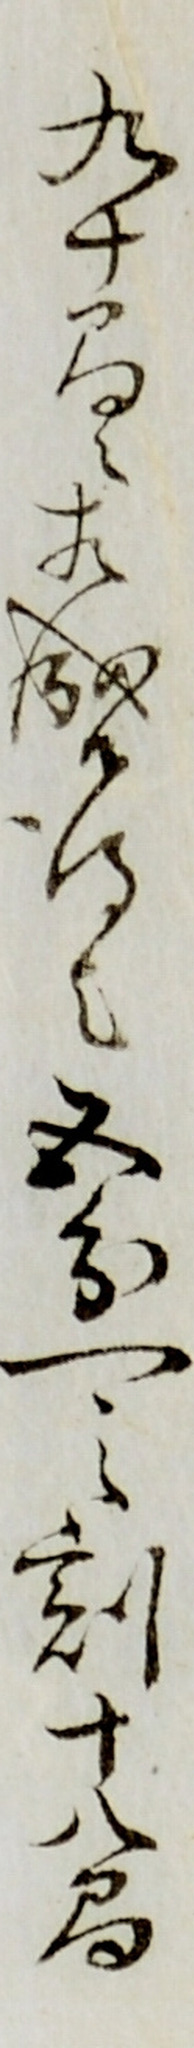九十間に相成候得は五分一之割十八間
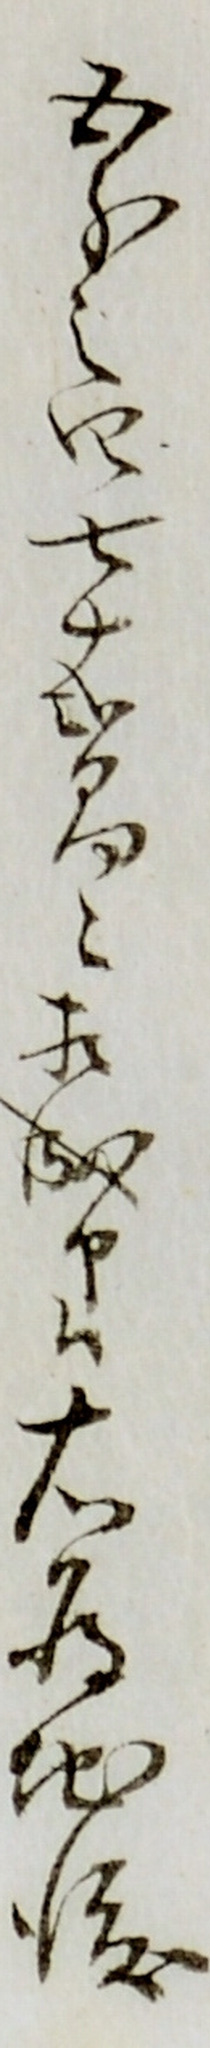五分之四七十弐間に相成申候右為地渡
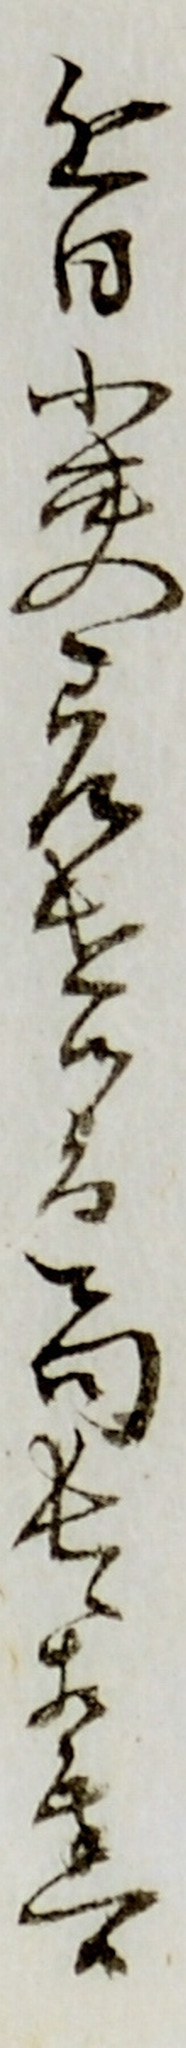近日小吏差遣候旨局長へ相達候
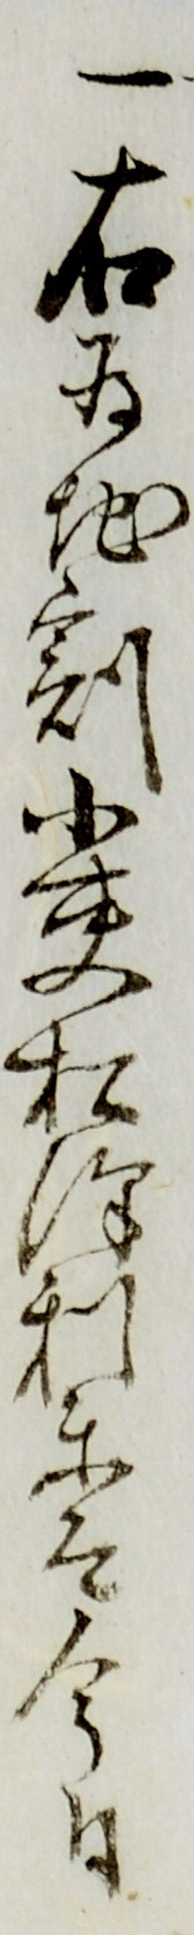一右為地割小吏松沢利東太今日
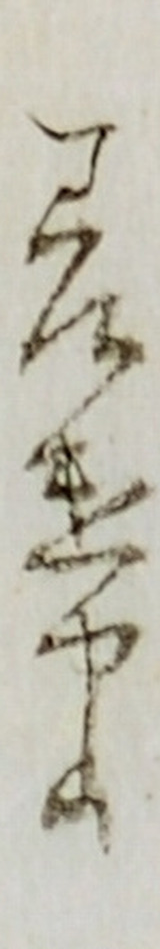差遣申候
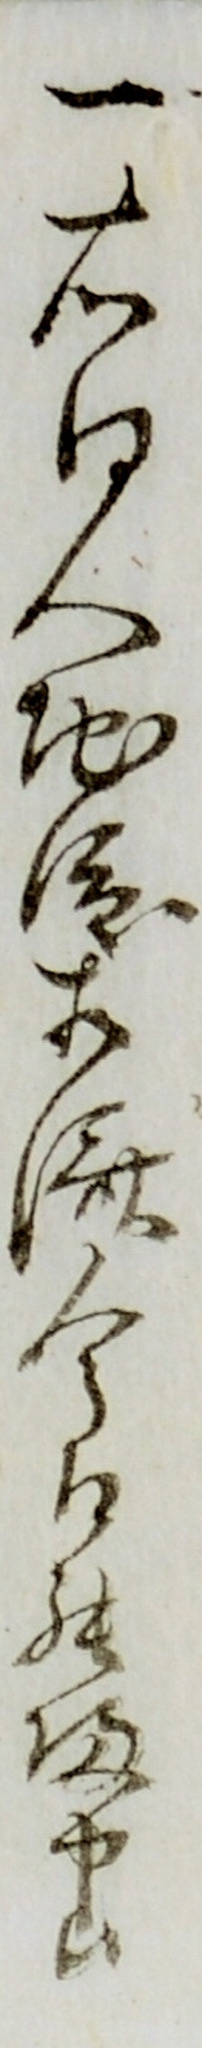一右同人地渡相済今日罷帰申候
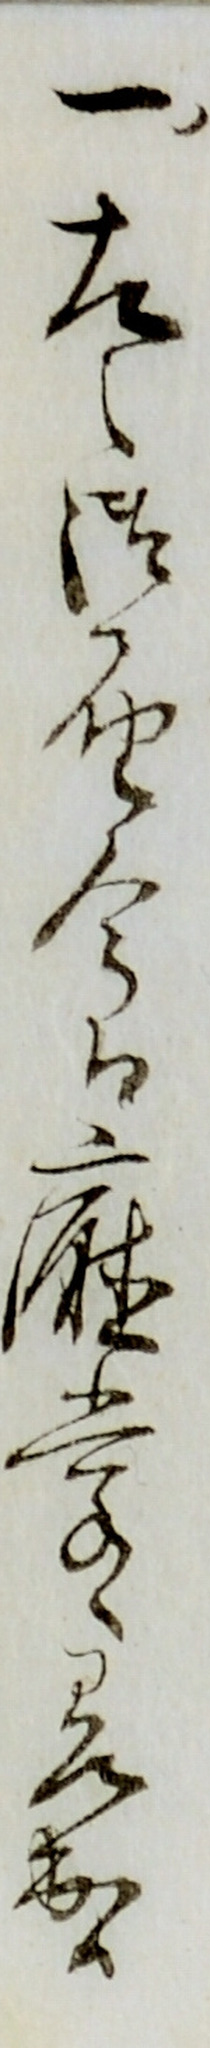一左之御届今日庁掌へ差出候
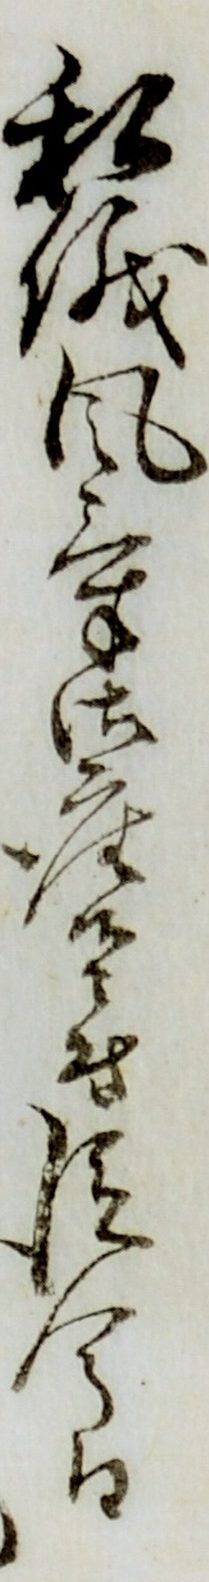私儀風気御座候に付従今日
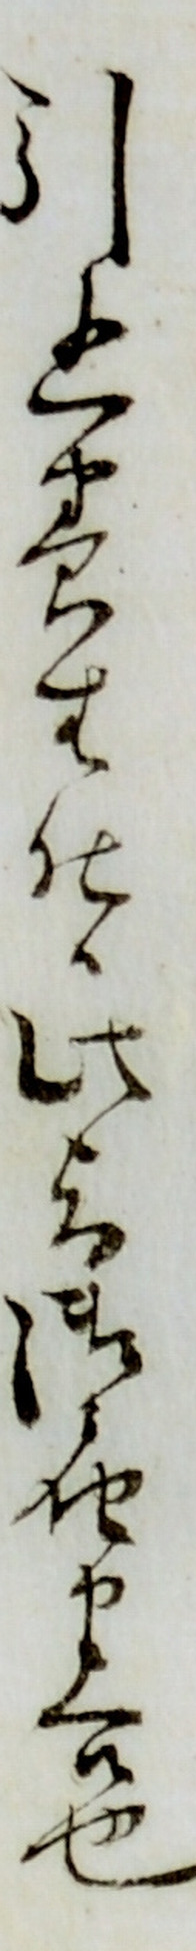引上養生仕候此旨御届申上候也
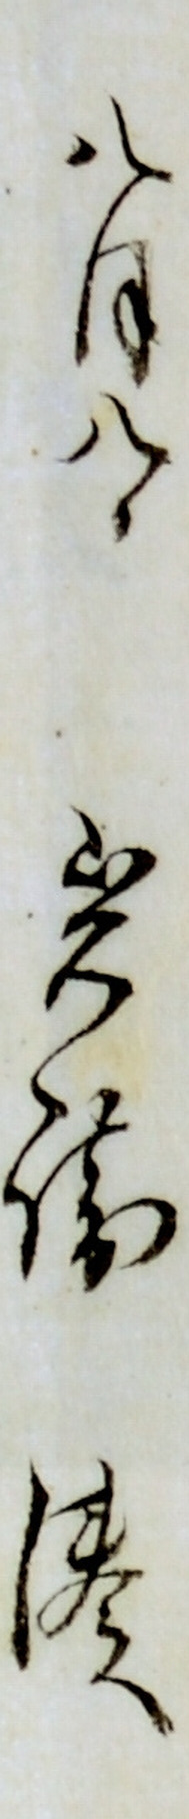八月八日岩崎湊

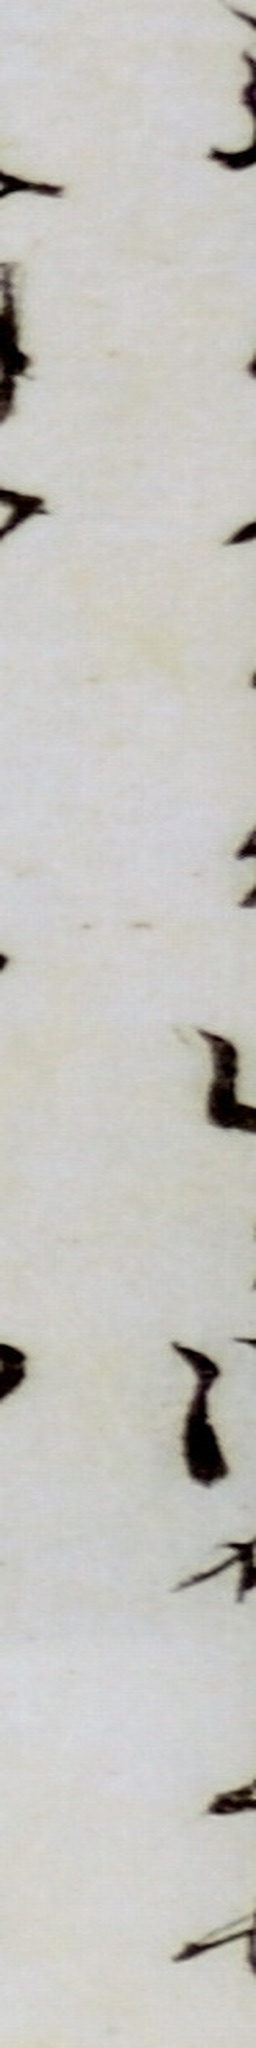十四日
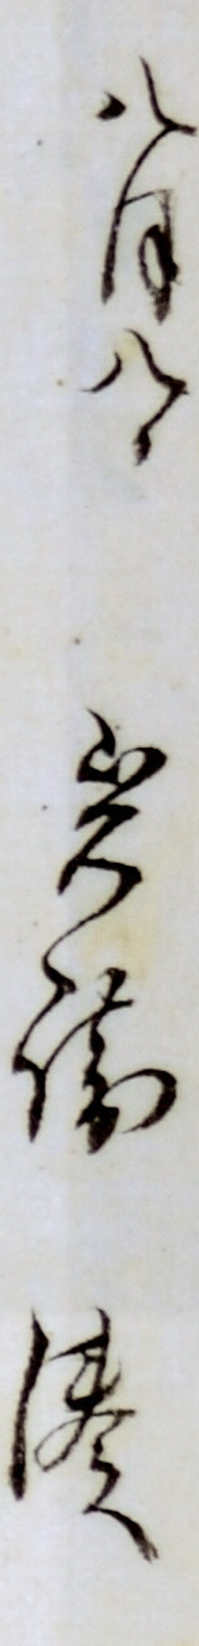八月十四日岩崎湊
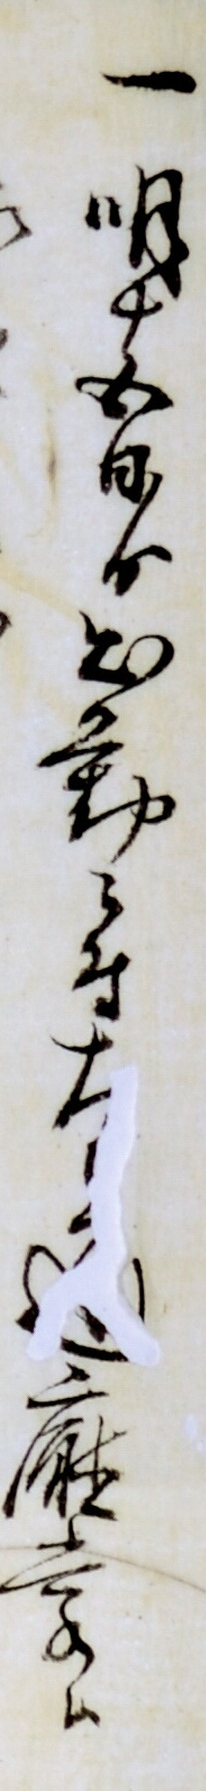一明十五日ゟ出勤に付左之通庁掌え
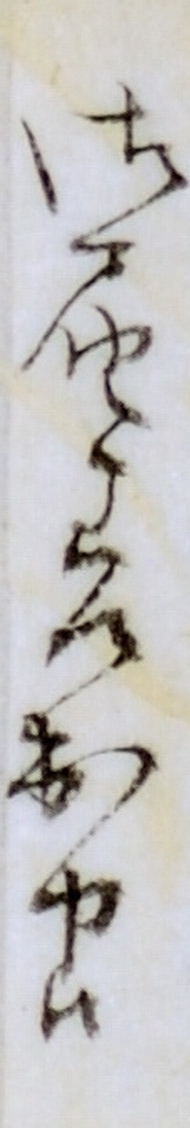御届差出申候
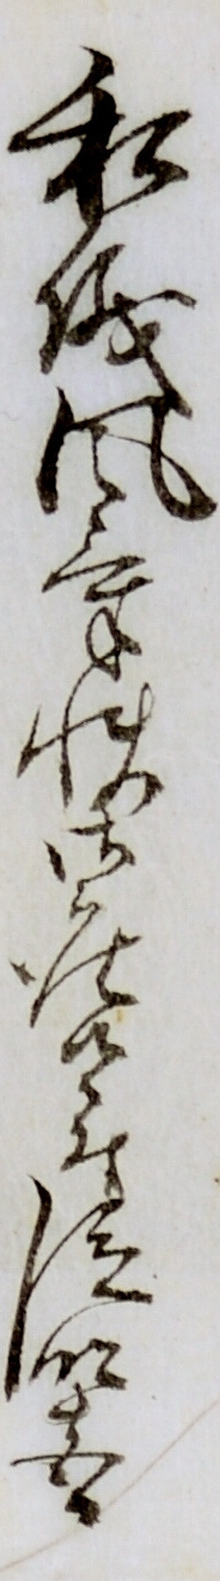私儀風気快御座候に付従明十五日
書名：山林方諸事御用留
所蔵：伊那市立高遠町図書館・合同会社AMANE
